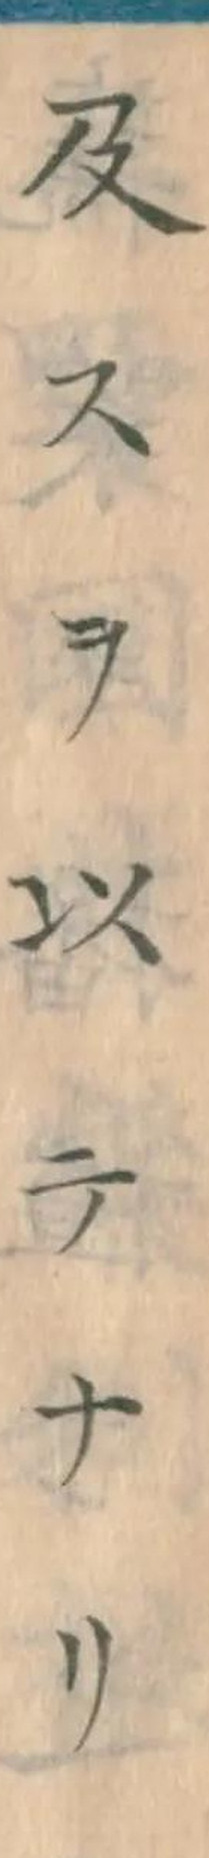及スヲ以テナリ
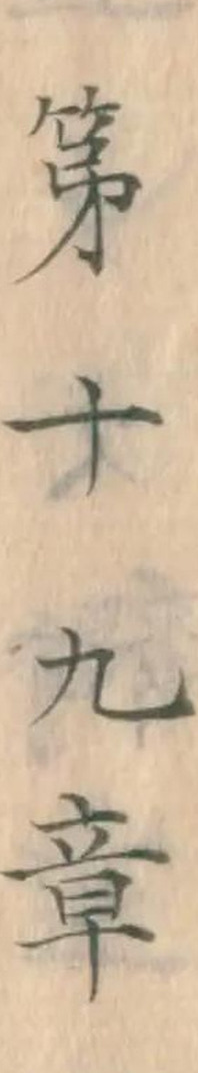第十九章
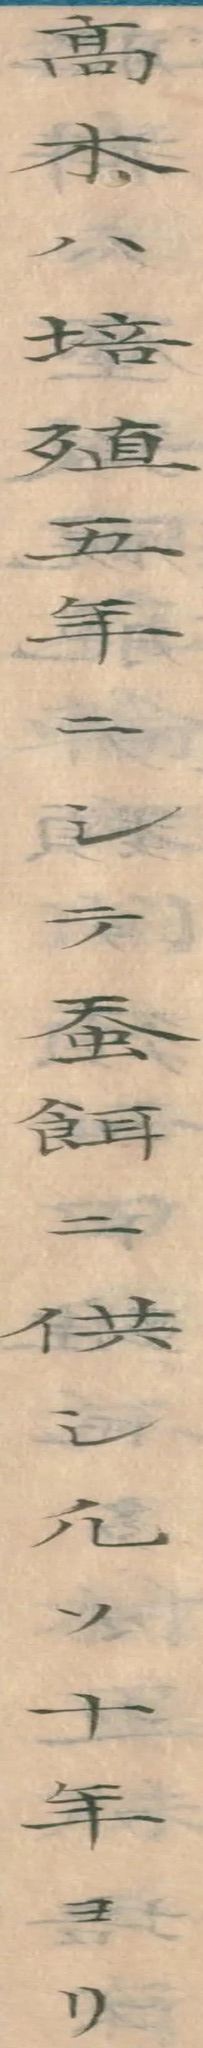高木ハ培殖五年ニシテ蚕餌ニ供シ凡ソ十年ヨリ
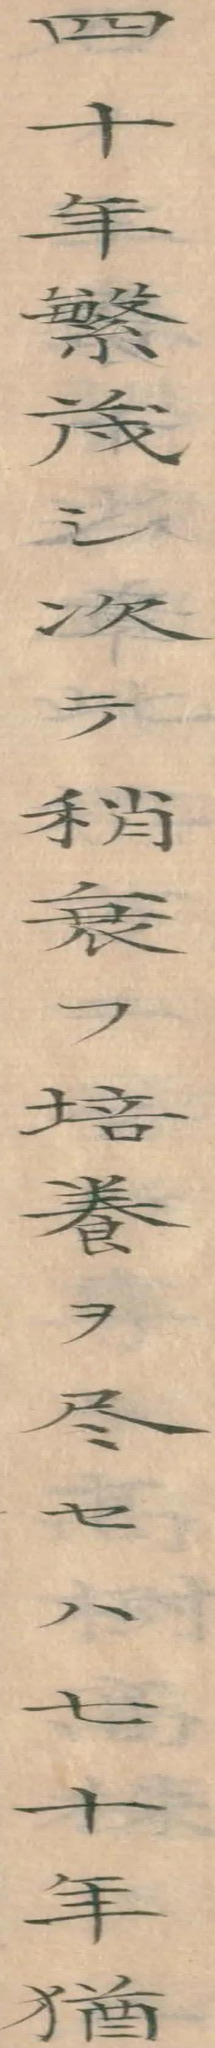四十年繁茂シ次テ稍衰フ培養ヲ尽セハ七十年猶
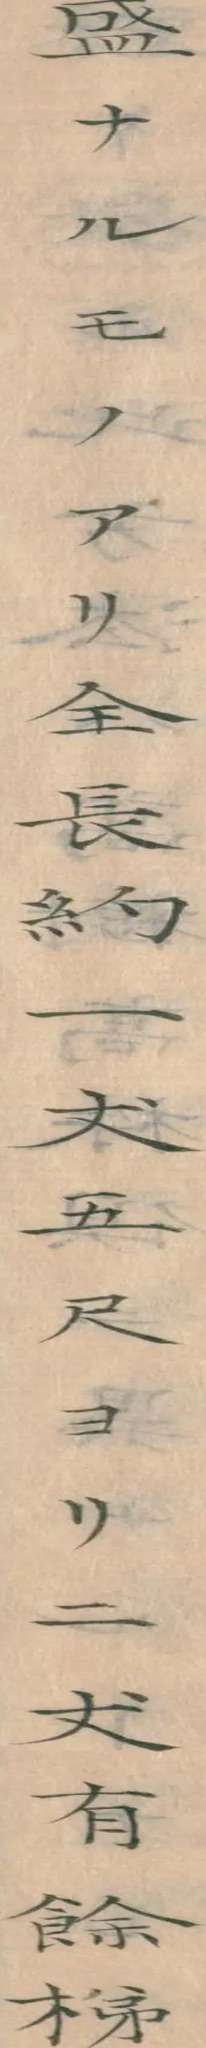盛ナルモノアリ全長約一丈五尺ヨリ二丈有余梯
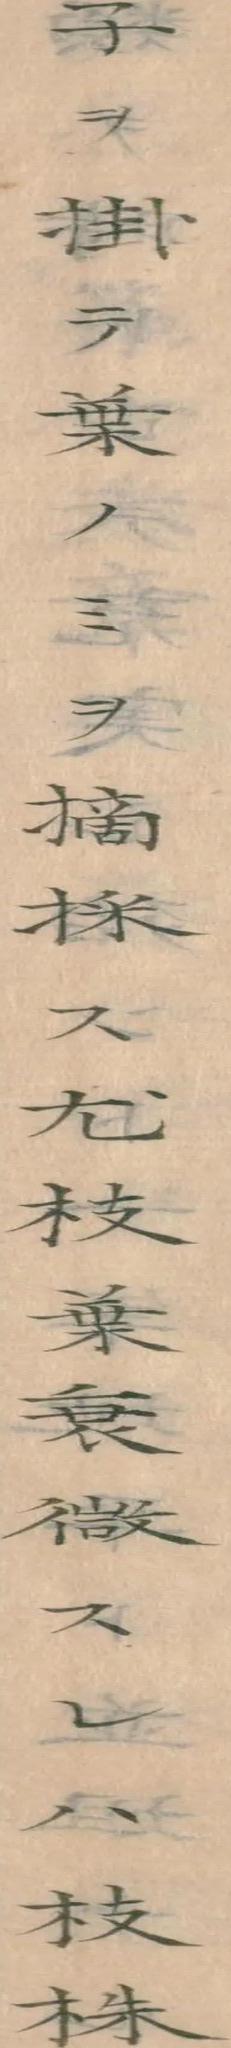子ヲ掛テ葉ノミヲ摘採ス尤枝葉衰微スレハ枝株
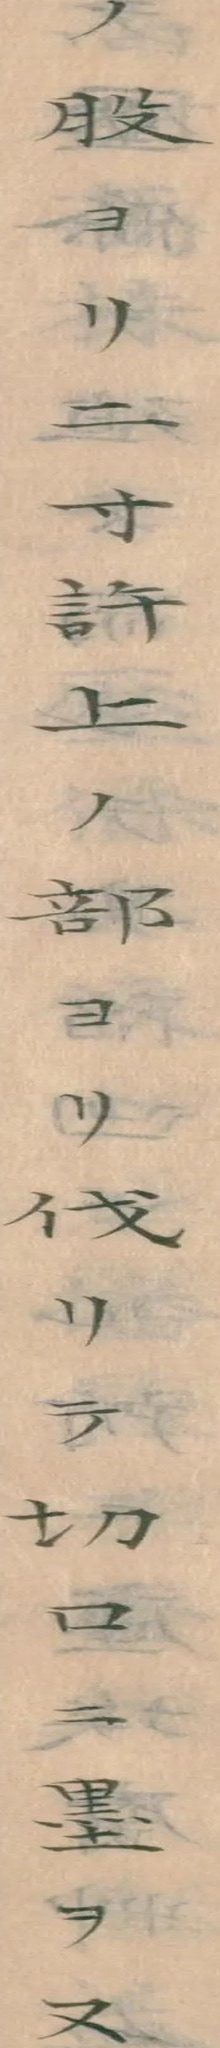ノ股ヨリ二寸許上ノ部ヨリ伐リテ切口ニ墨ヲヌ
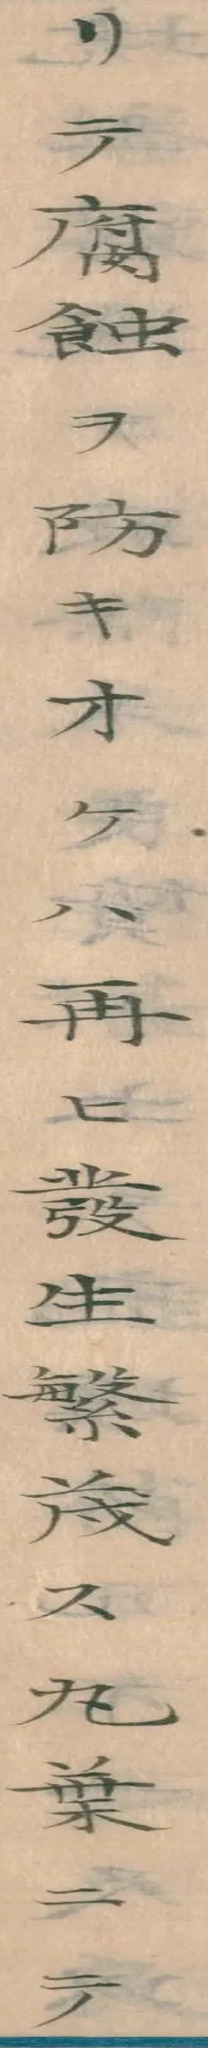リテ腐蝕ヲ防キオケハ再ヒ発生繁茂ス丸葉ニテ
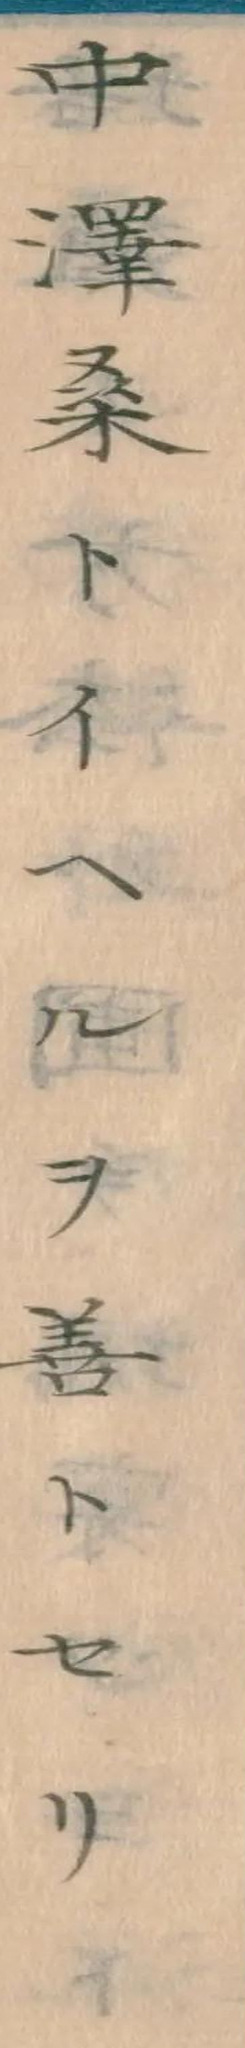中沢桑トイヘルヲ善トセリ
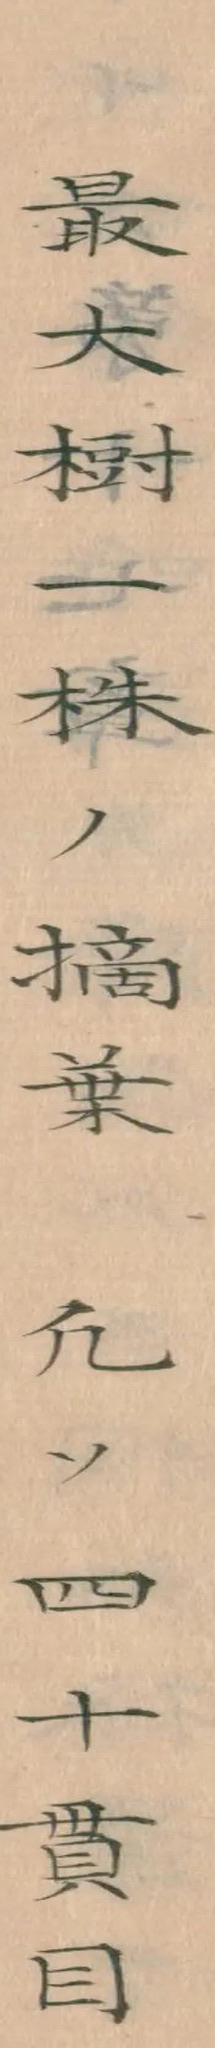最大樹一株ノ摘葉凡ソ四十貫目
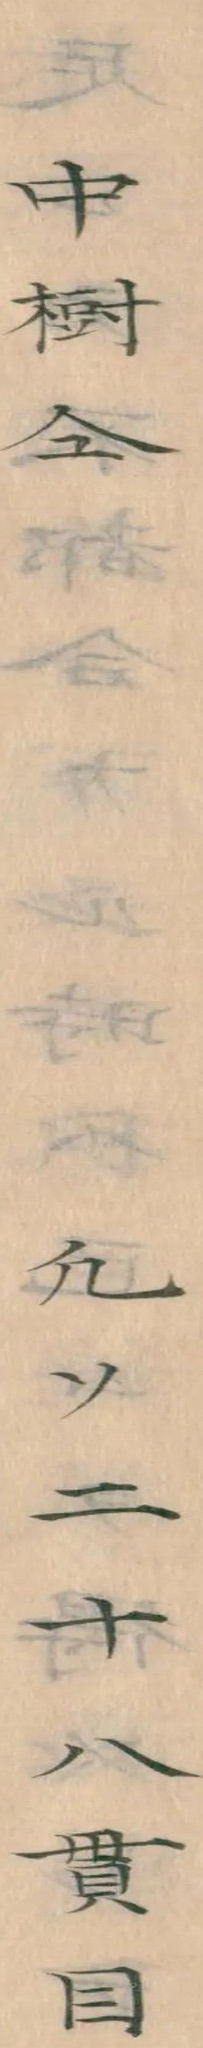中樹仝凡ソ二十八貫目
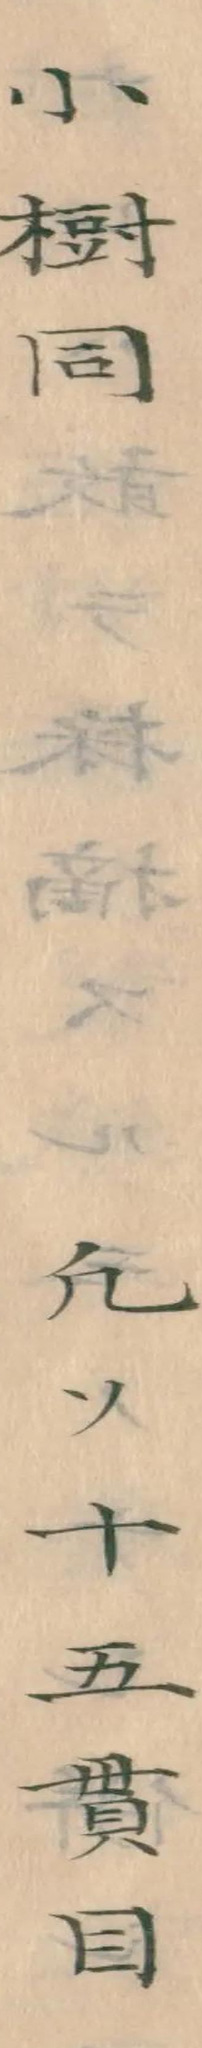小樹同凡ソ十五貫目
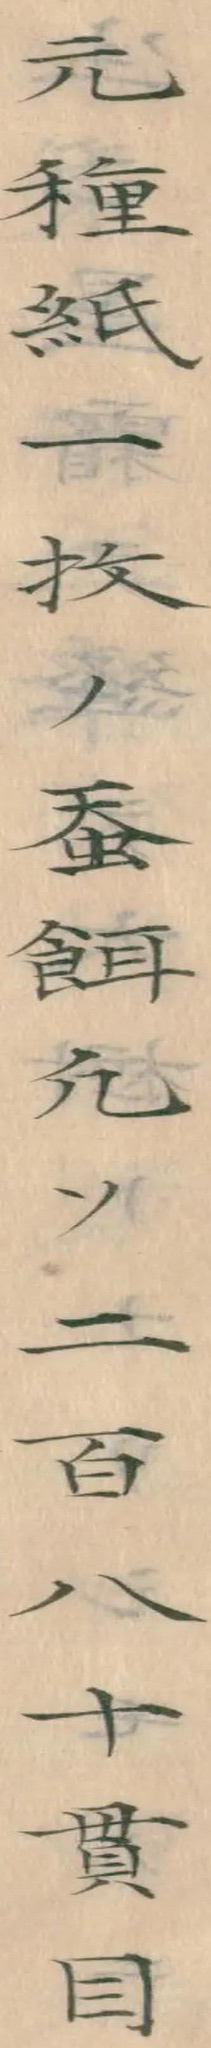元種紙一枚ノ蚕餌凡ソ二百八十貫目
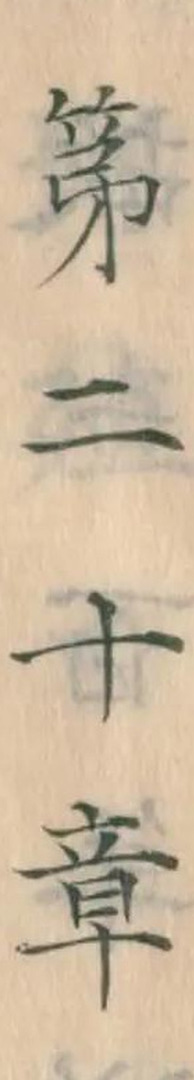第二十章
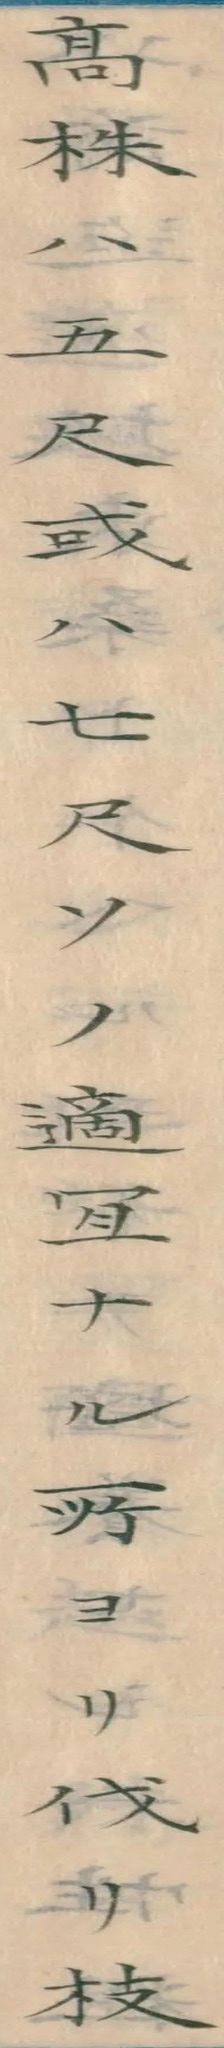高株ハ五尺或ハ七尺ソノ適宜ナル所ヨリ伐リ枝
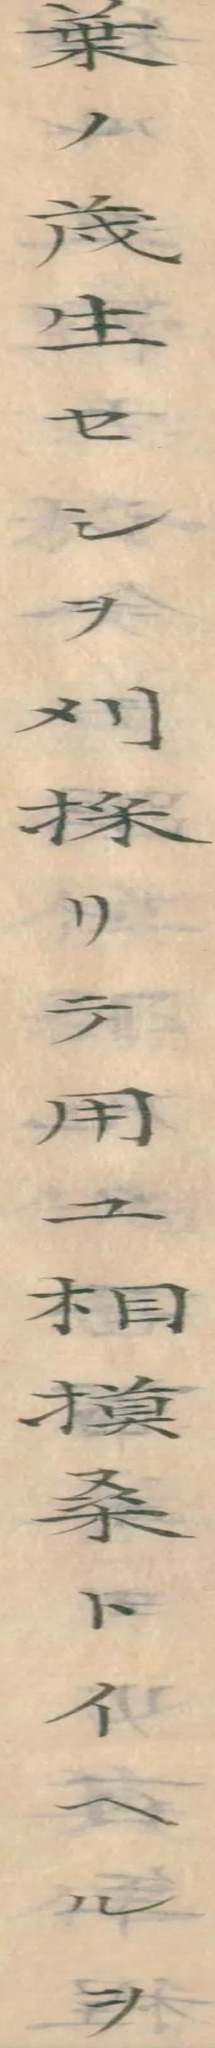葉ノ茂生セシヲ刈採リテ用ユ相摸桑トイヘルヲ
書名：蚕桑集成
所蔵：国立国会図書館 National Diet Library, JAPAN
